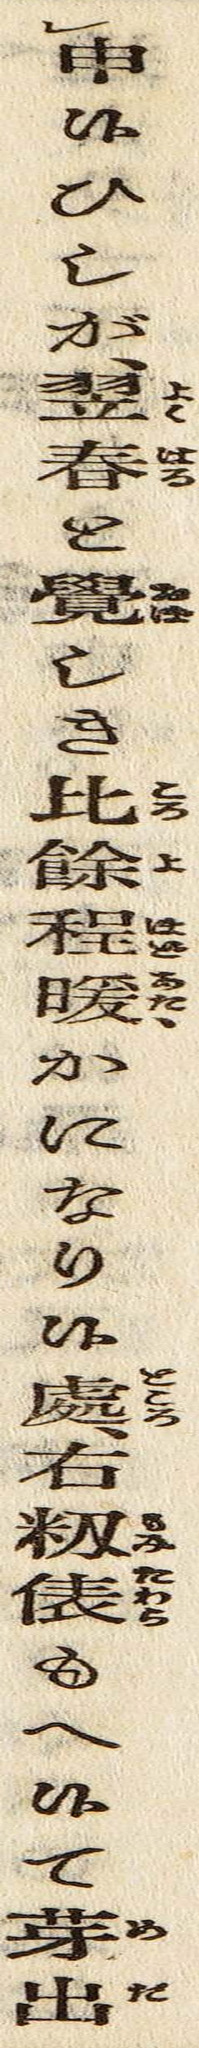申候ひしが、翌春と覚しき比余程暖かになり候処、右籾俵もへ候て芽出
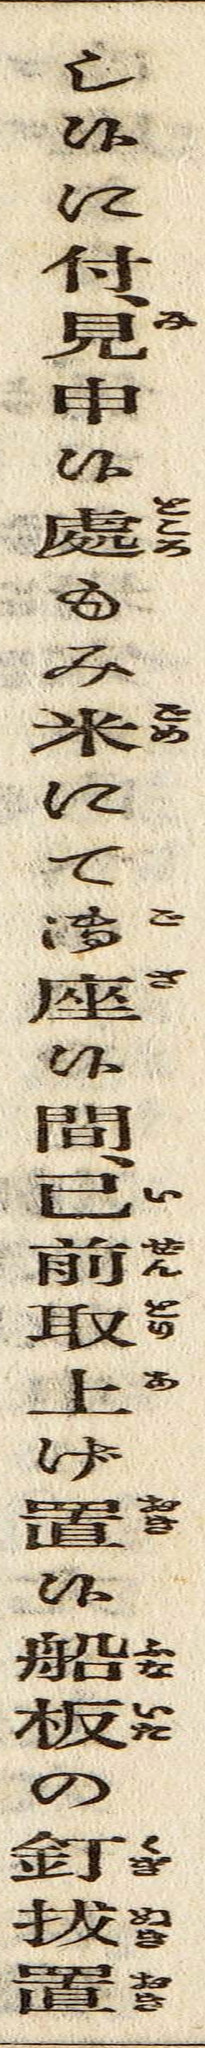し候に付、見申候処もみ米にて御座候間、已前取上げ置候船板の釘抜置
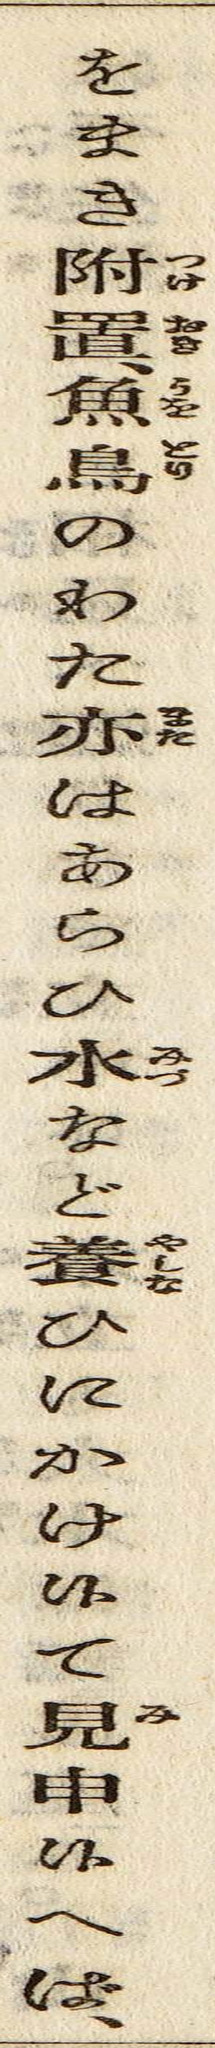をまき附置、魚鳥のわた亦はあらひ水など養ひにかけ候て見申候へば、
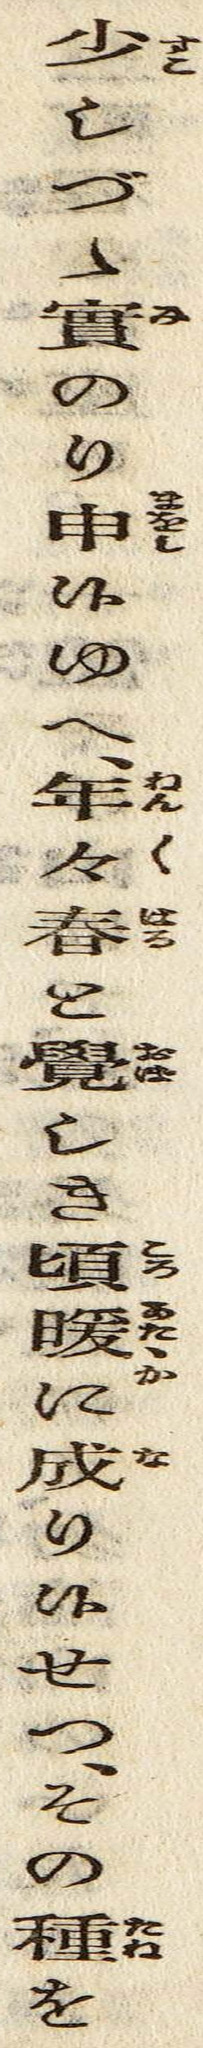少しづゝ実のり申候ゆへ、年々春と覚しき頃暖に成り候せつ、その種を
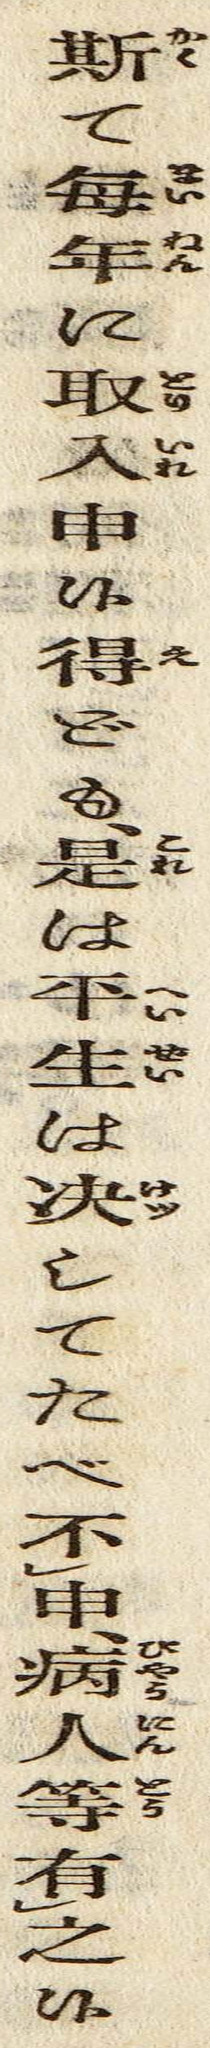斯て毎年に取入申候得ども、是は平生は決してたべ不申、病人等有之候

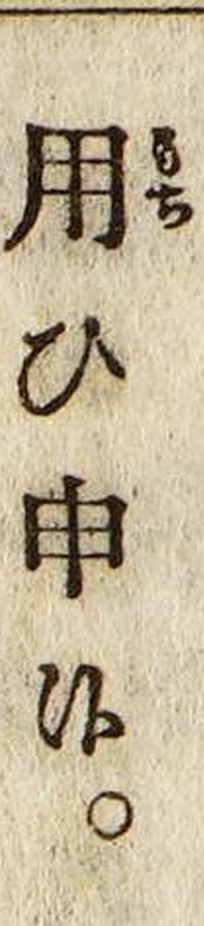用ひ申候。
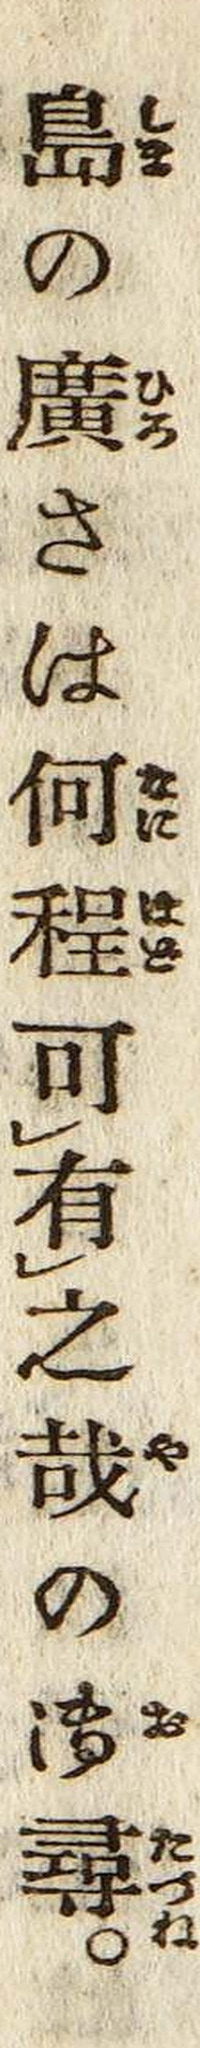島の広さは何程可有之哉の御尋。
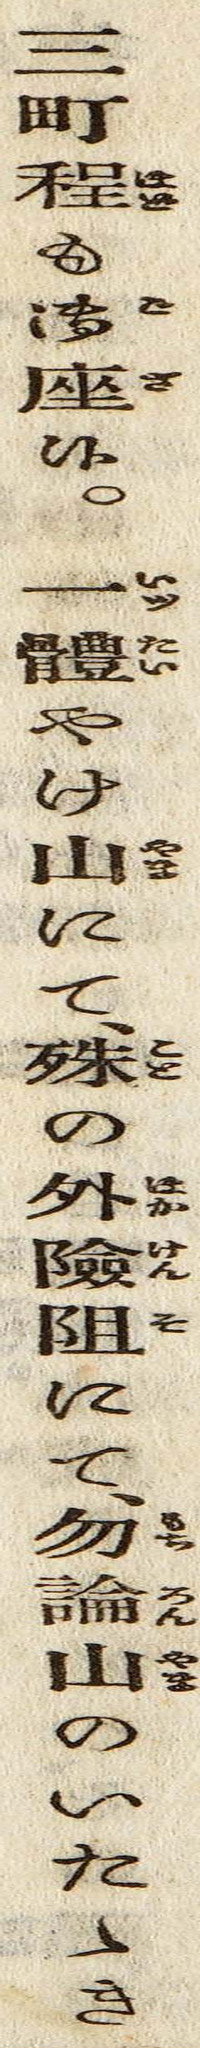三町程も御座候。一体やけ山にて、殊の外険阻にて、勿論山のいたゝき
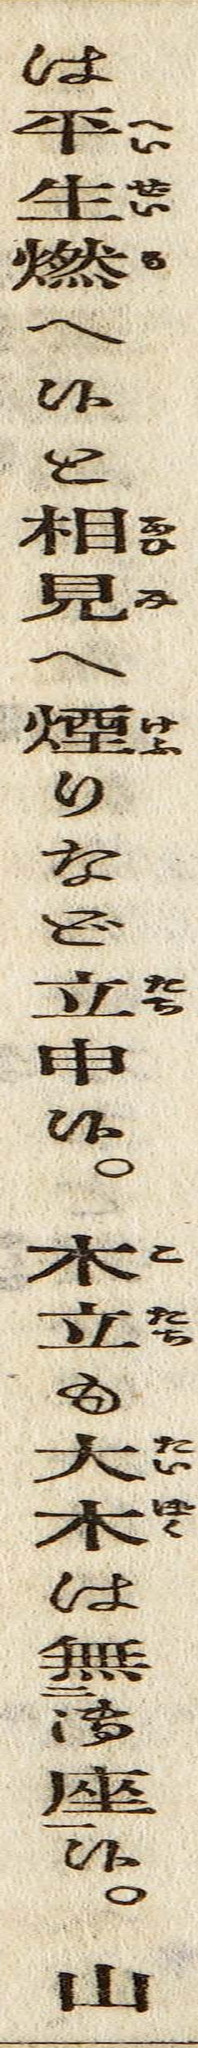は平生燃へ候と相見へ煙りなど立申候。木立も大木は無御座候。山
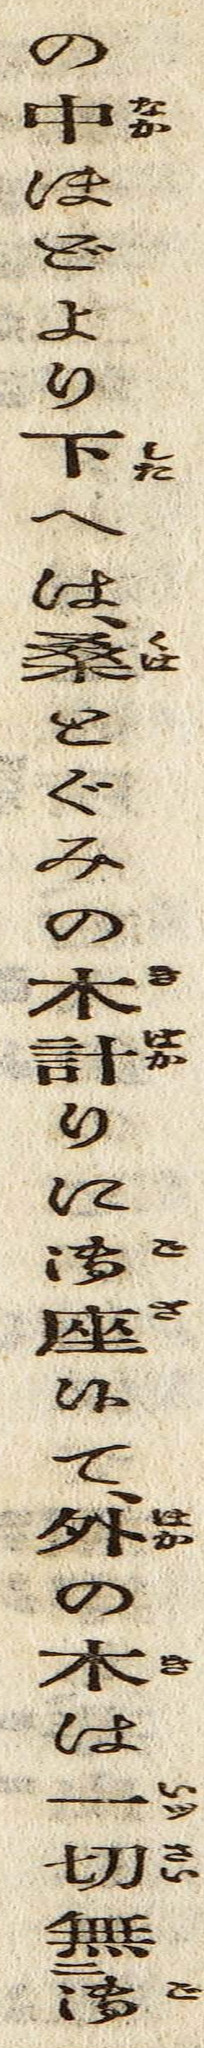の中ほどより下へは、桑とぐみの木許りに御座候て、外の木は一切無御
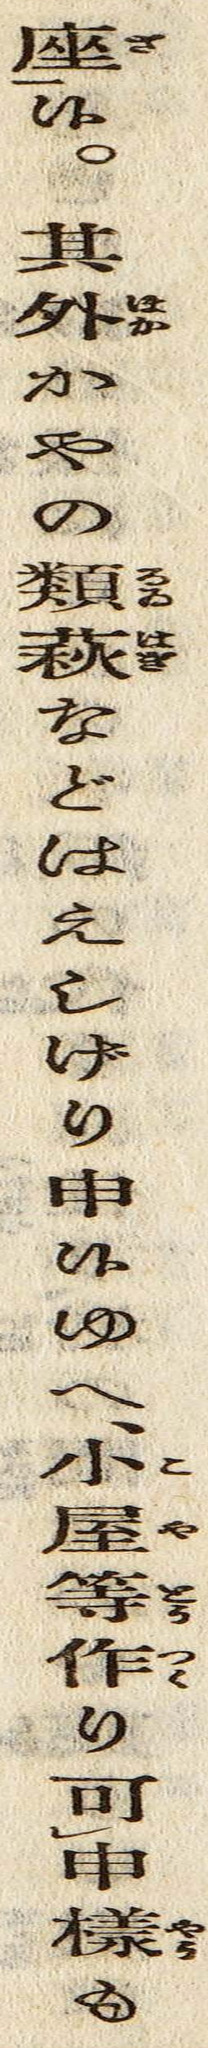座候。其外かやの類萩などはえしげり申候ゆへ、小屋等作り可申様も
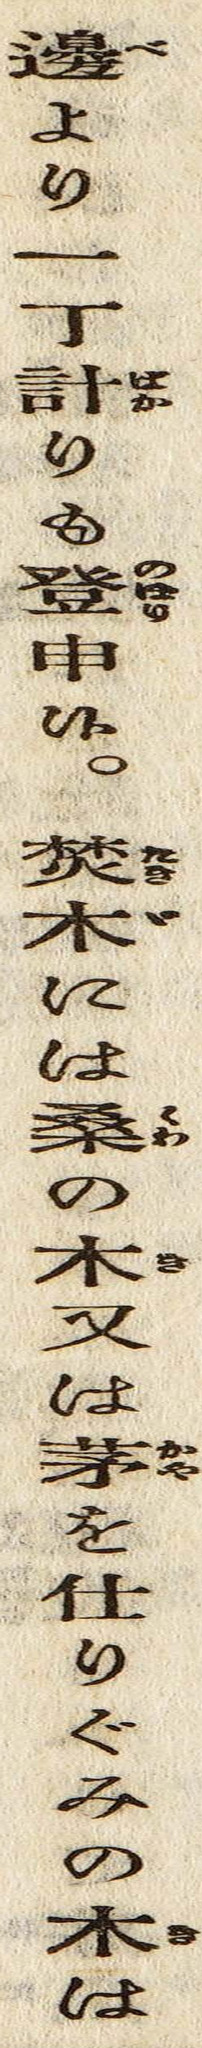辺より一丁計りも登申候。焚木には桑の木又は茅を仕りぐみの木は
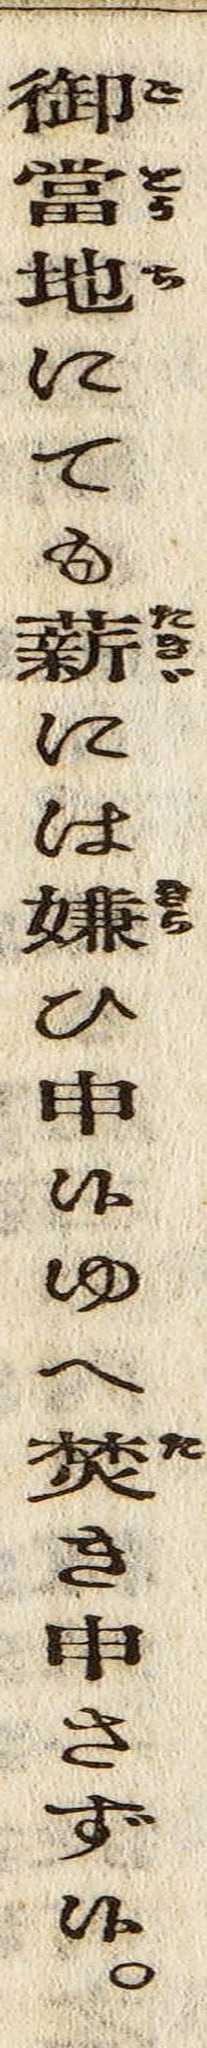御当地にても薪には嫌ひ申候ゆへ焚き申さず候。
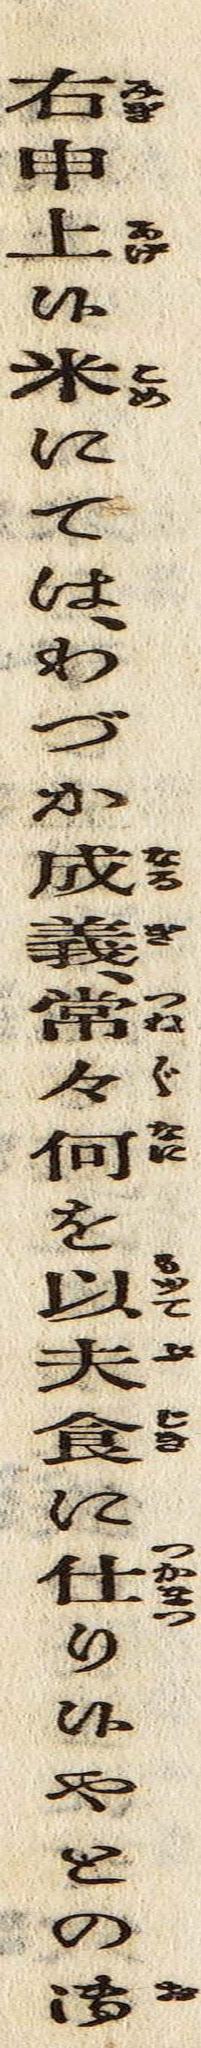右申上候米にては、わづか成義、常々何を以夫食に仕り候やとの御
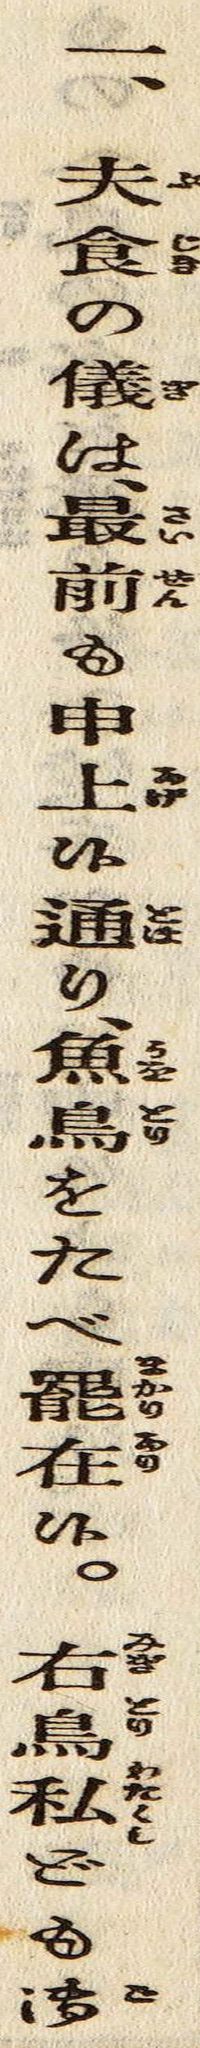一、夫食の儀は、最前も申上候通り、魚鳥をたべ罷在候。右鳥私ども御
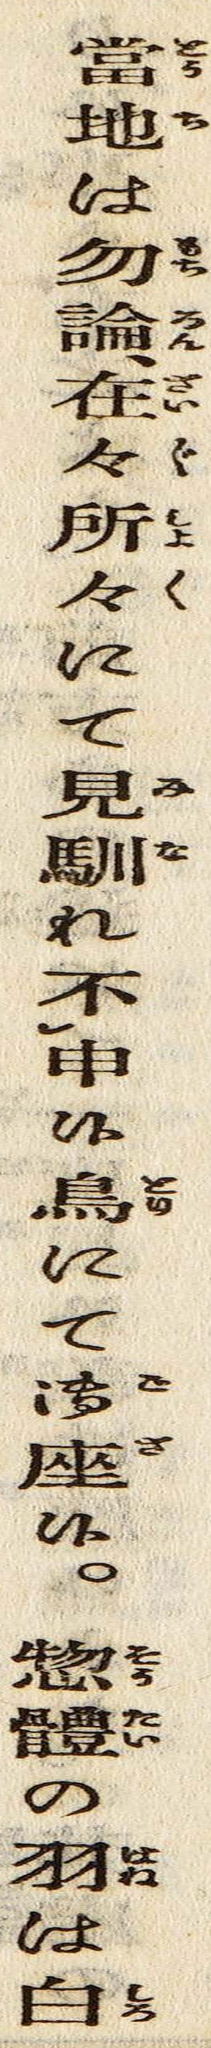当地は勿論、在々所々にて見馴れ不申候鳥にて御座候。総体の羽は白
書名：日本漂流譚
